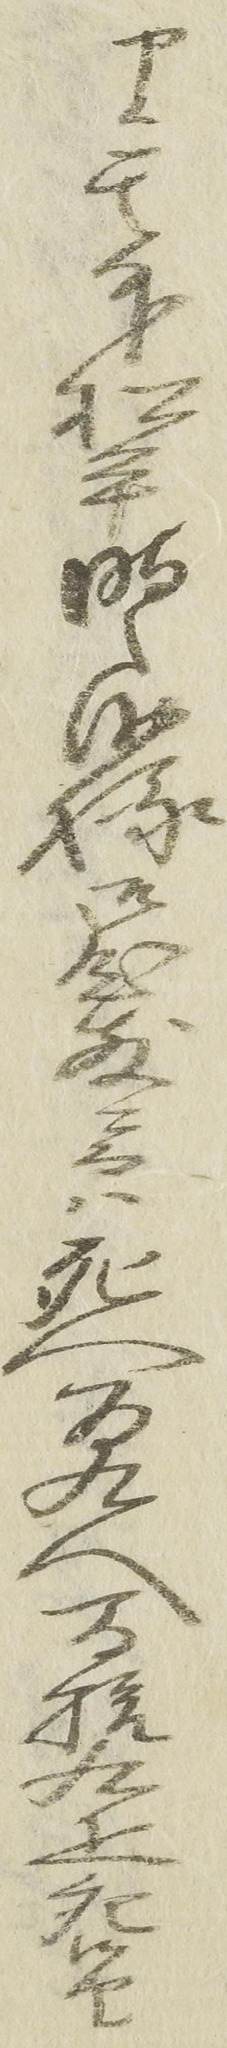申候其外松平時之助様御屋敷ニ而ハ死人百九人馬拾九疋死候由
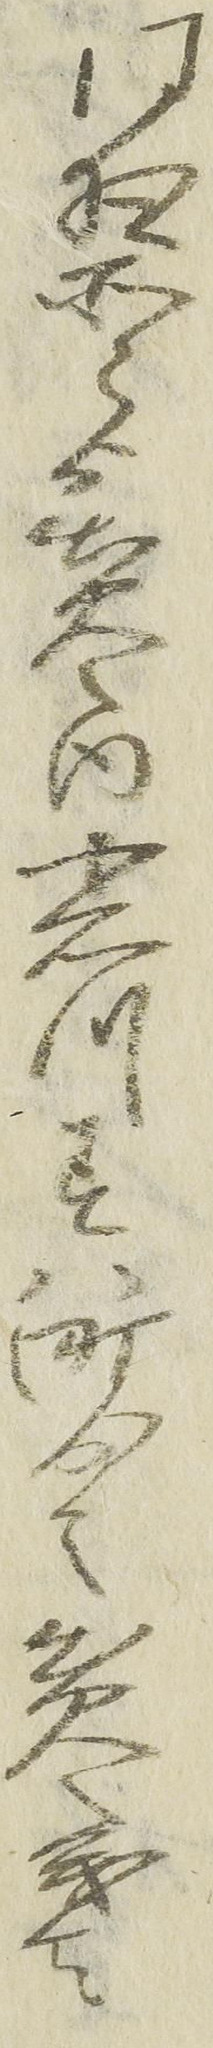同夜所〻ゟ出火之内小石川すハ町ゟ之出火之義は

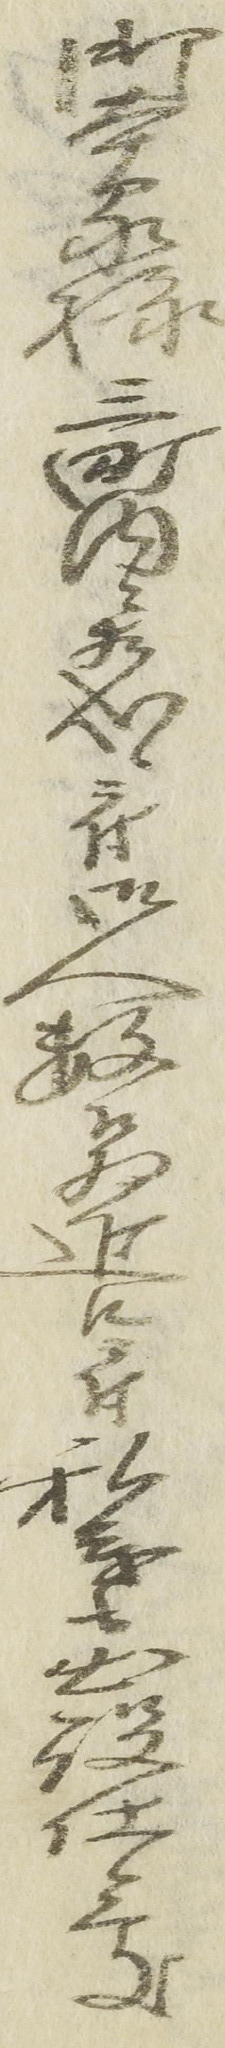御本家様三町内ニ相成候ニ付御人数被為近候ニ付私義も出役仕候処
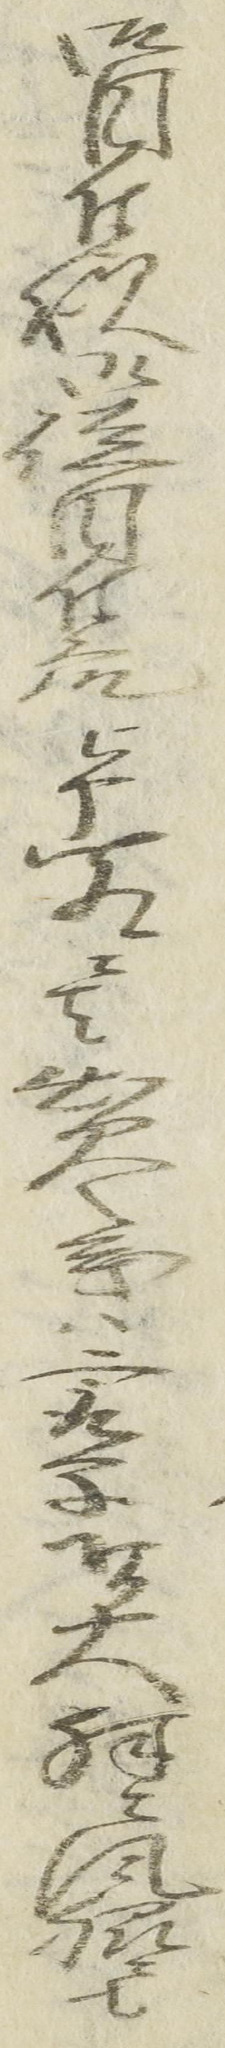御目付様御徒目付衆被申聞候ニは出火之義ハ最早下タ火殊ニ風脇ニも
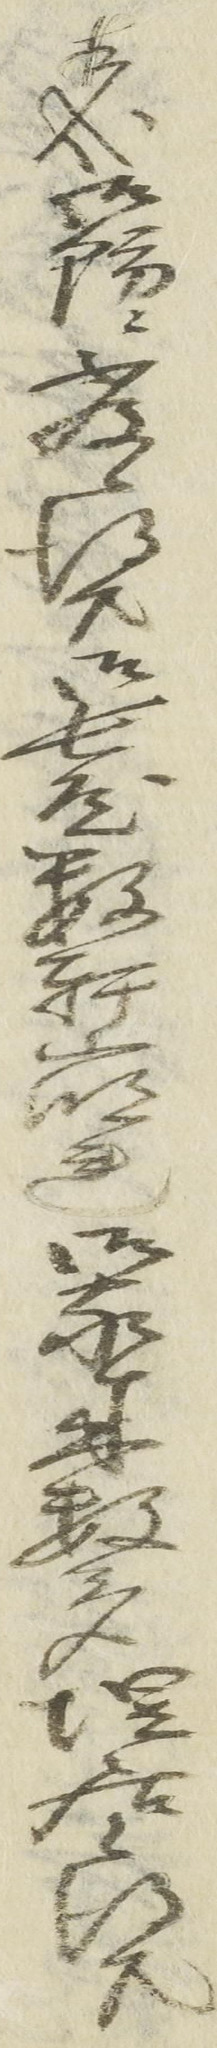相成御防ニ不及候得共御長屋数軒崩れ御家来数多埋居候得共
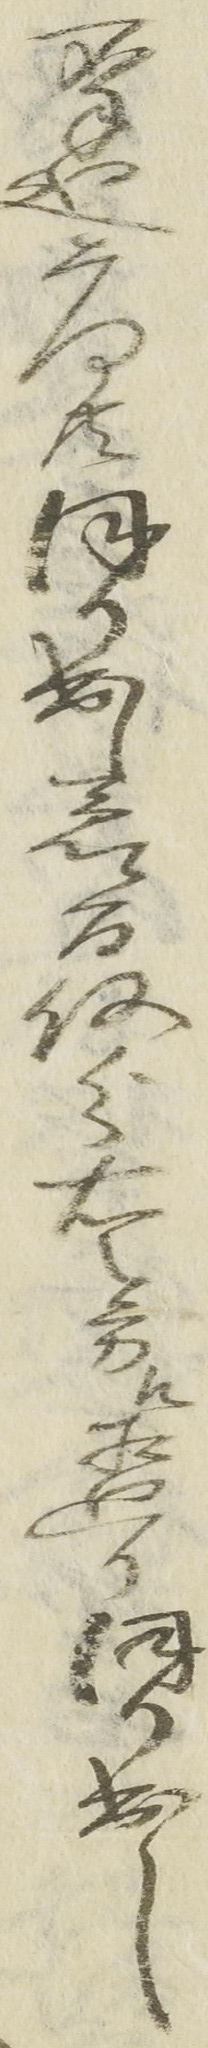不手廻如何共ほり出し兼候間何分右之方江相廻りほり出し
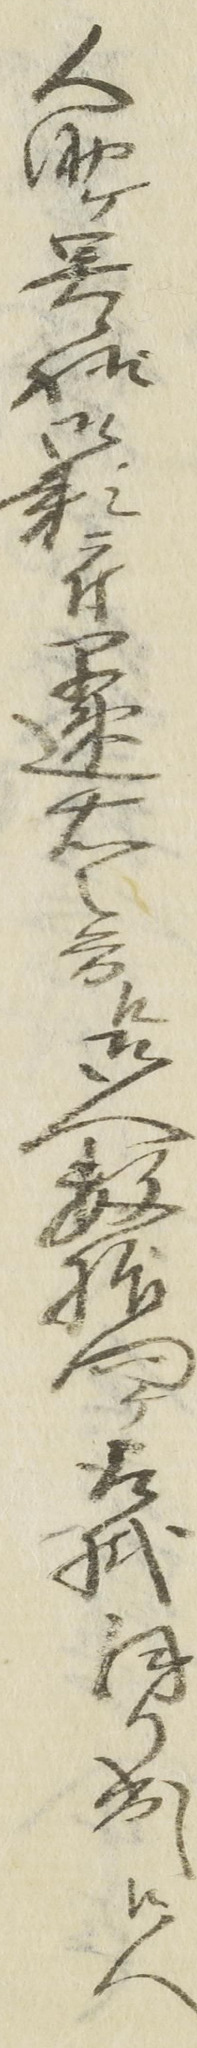人助ケ呉候様御頼ニ付早速右之方江御人数指向ケ取掛ほり出し候人
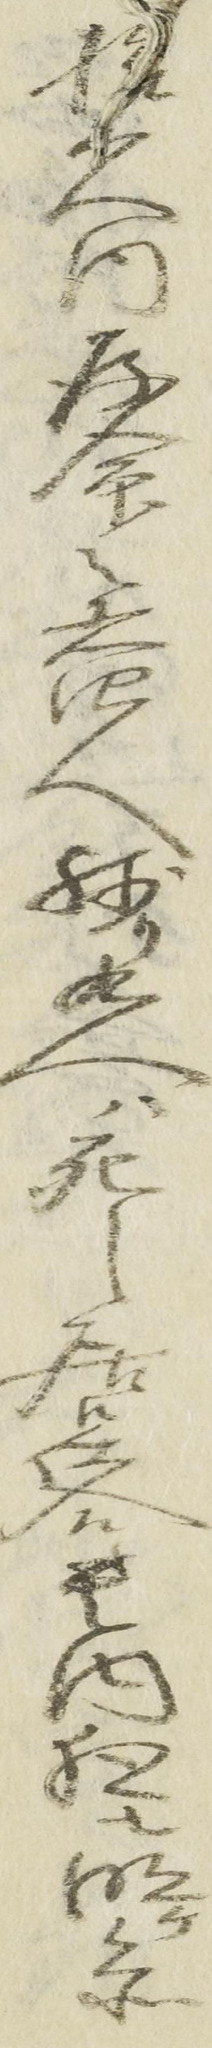拾三人内存命之者四人残り九人ハ死し居候仕合之内夜も明ケ参
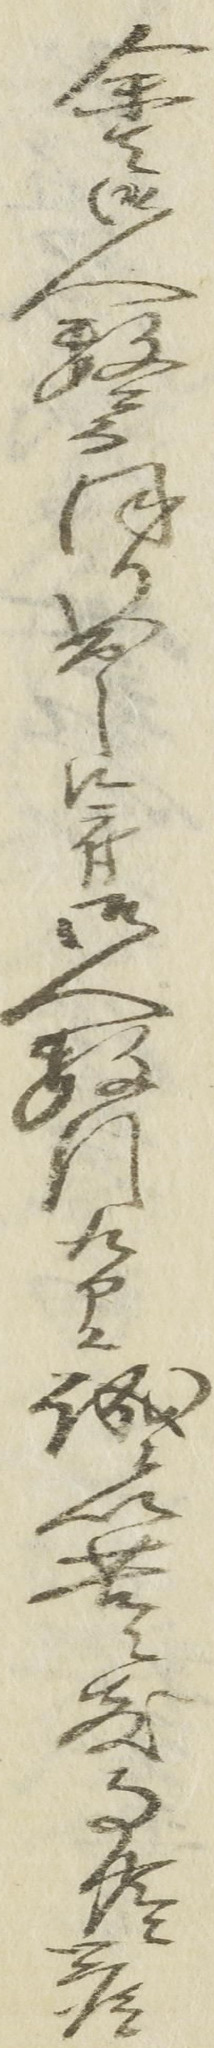余は御人数ニ而ほり出し候ニ付御人数引取申候誠ニ以苦〻敷事共ニ御座候
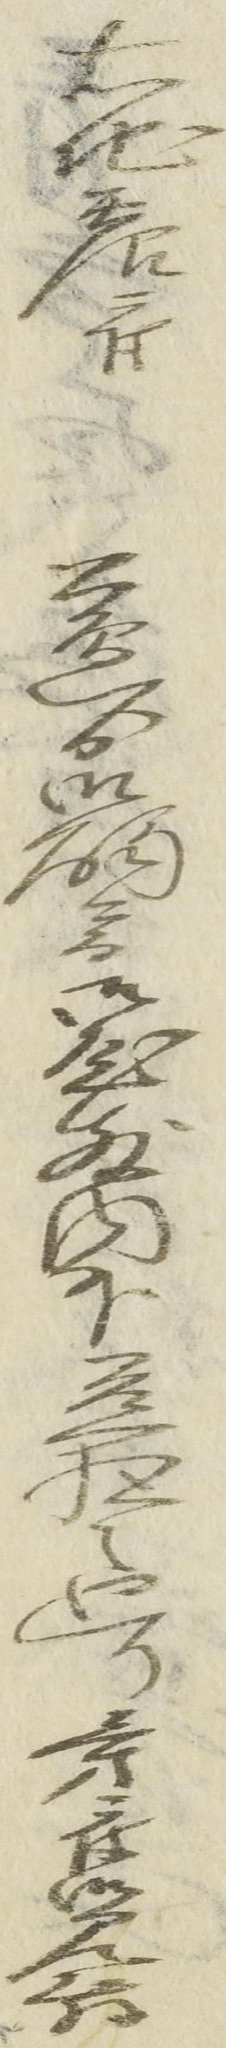右地震ニ付公辺ゟ御触ニ而御屋敷内外昼夜之廻り旁ニ付御見舞
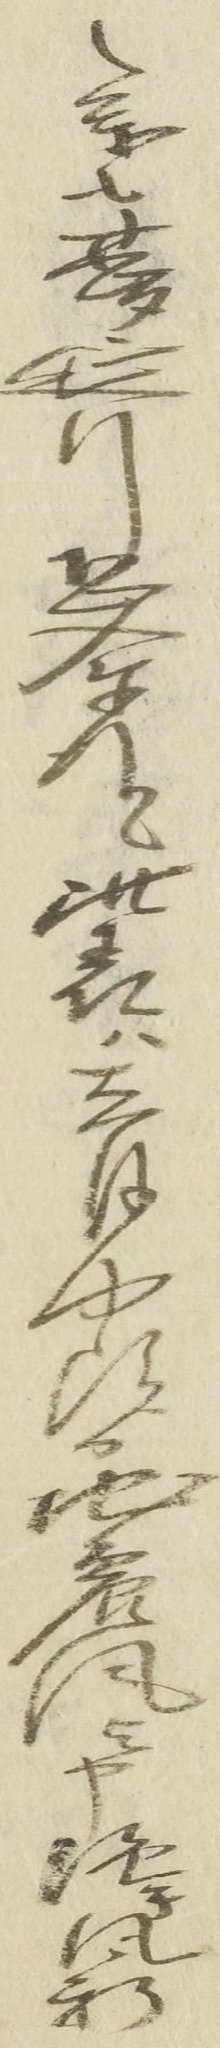之義も甚タ延引恐入奉存候此表ハ去月中頃ゟ地震風と申強キ風新
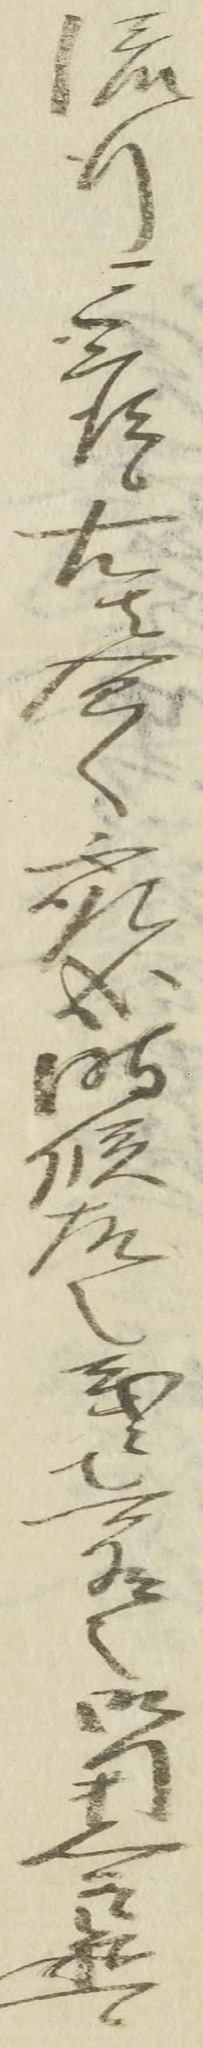流行ニ御座候右は全く不取成時候故之義ニて可有之御用心被遊候
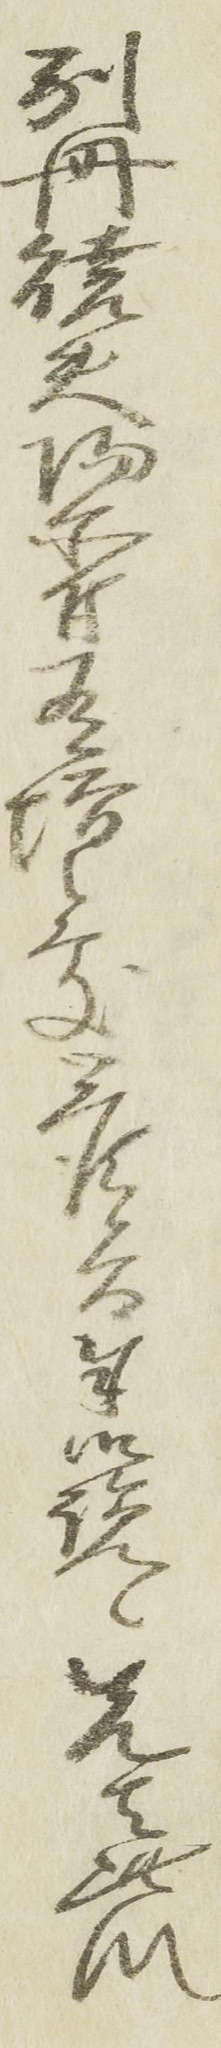別冊焼失場所付有増之処御座候間奉御覧候先は此段
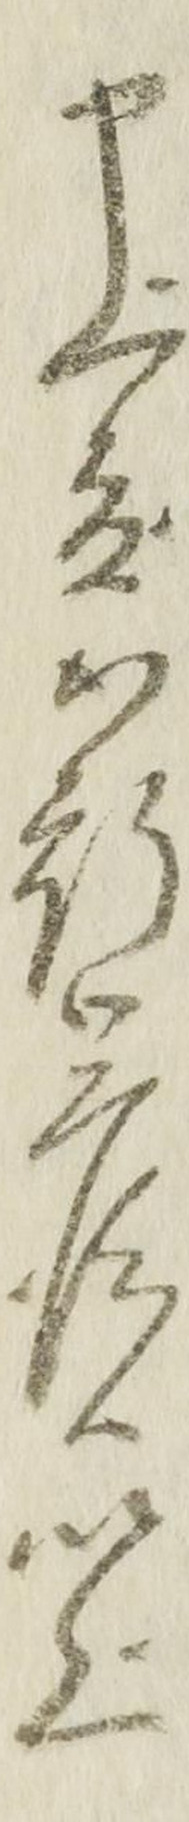申上度如斯御座候以上
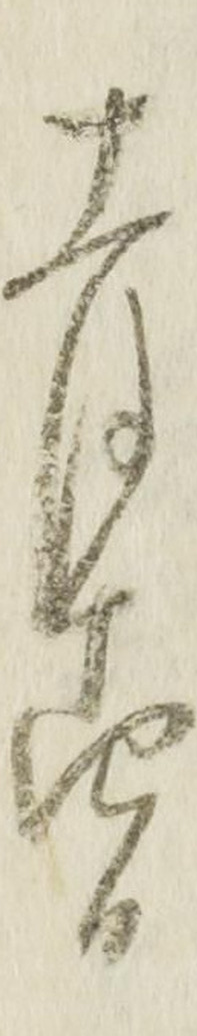十一月十四日

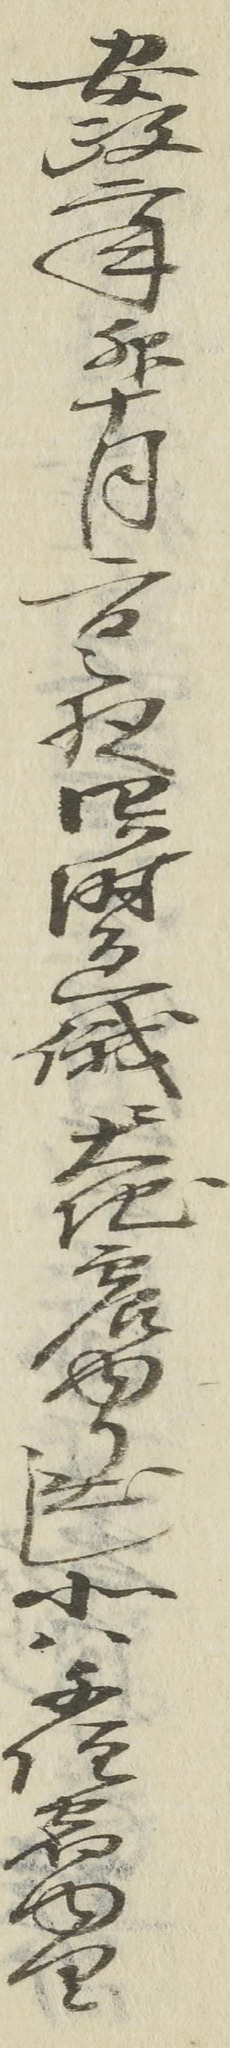安政二年卯十月二日之夜四ツ時過俄ニ大地震ゆり出し北ハ千住宿ゆり
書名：安政乙卯江戸大地震筆記　安政丙辰八月大阪大雷雨之記追加　安政三辰年七月松前辺大地震并八月大風雨記録
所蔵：東京大学地震研究所図書室 Earthquake Research Institute Library, The University of Tokyo, JAPAN
